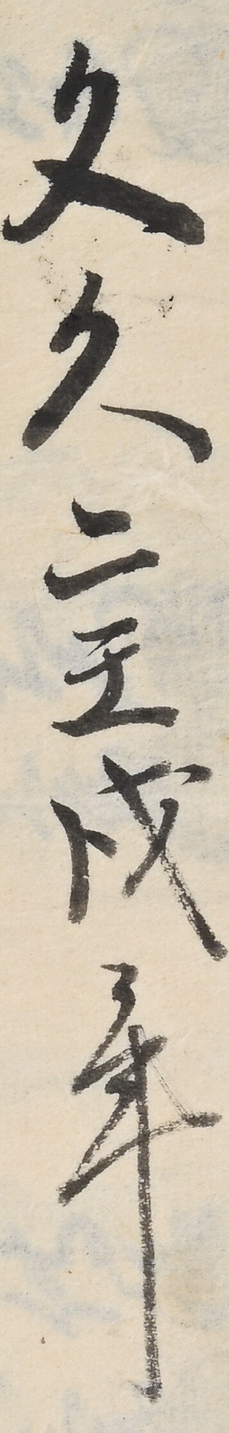文久二壬戌年
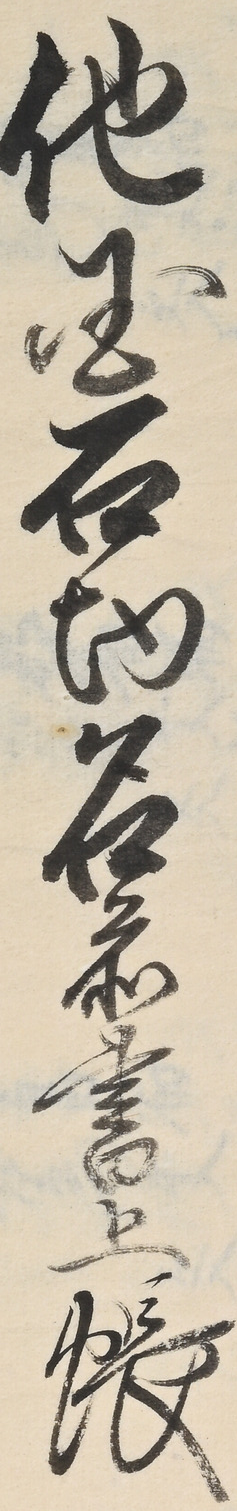他国石切名前書上帳
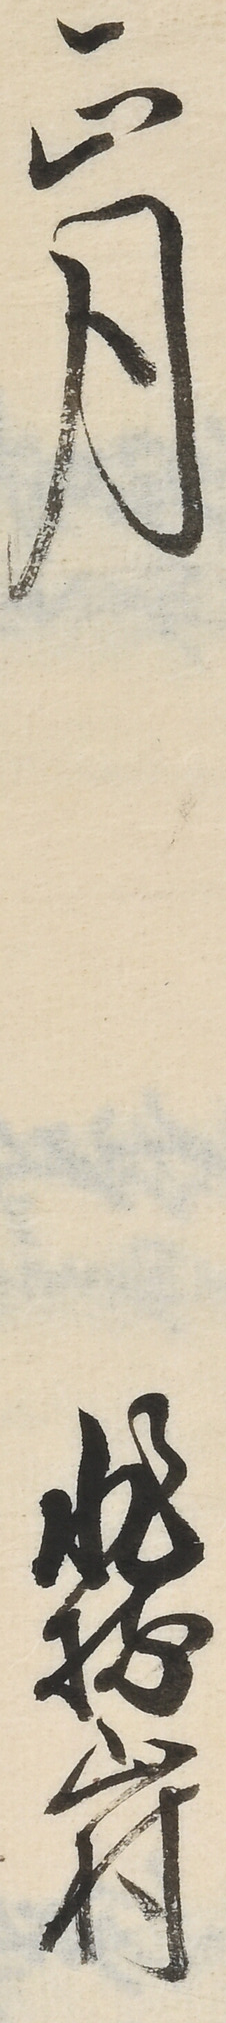正月非持山村

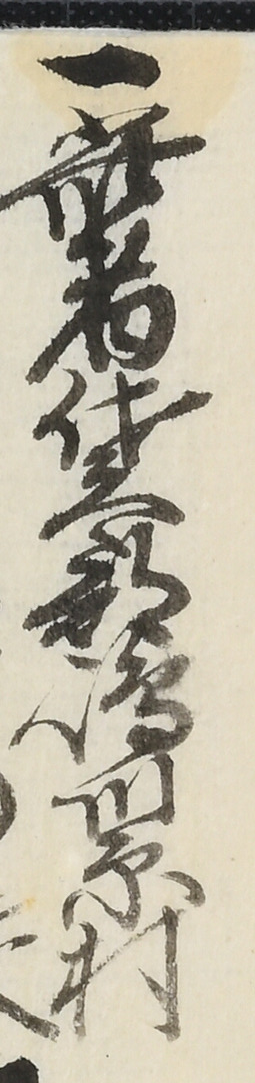一此者佐久郡島川原村

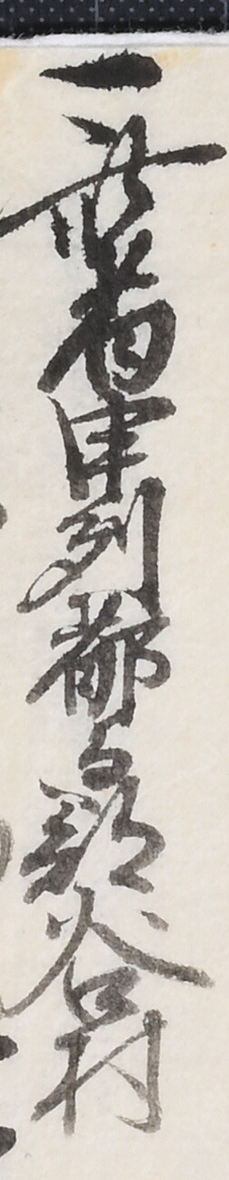一此者甲州都留郡谷村
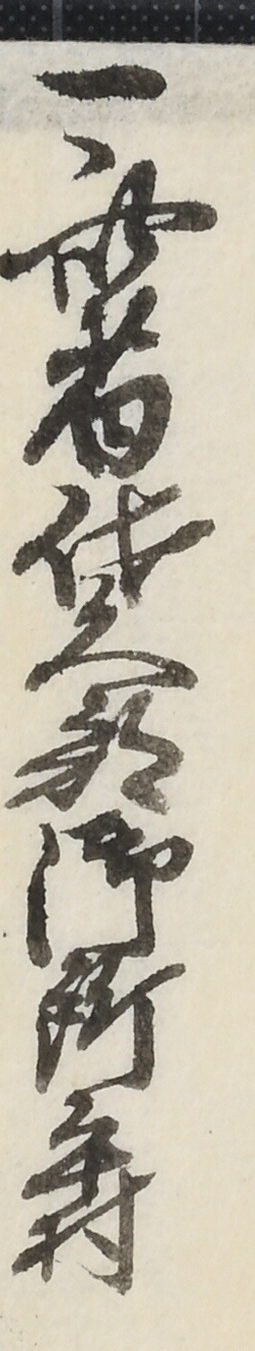一此者佐久郡御所平村
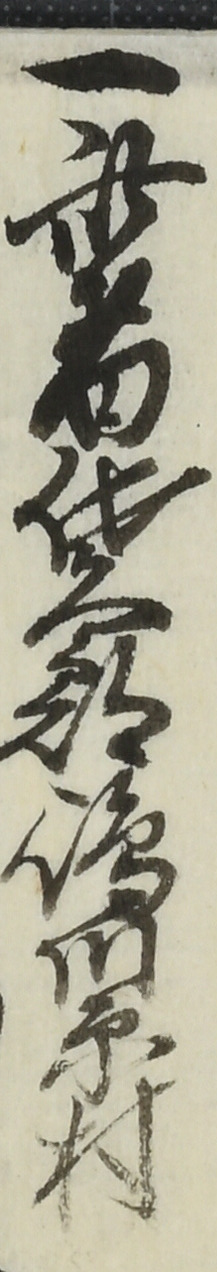一此者佐久郡島川原村

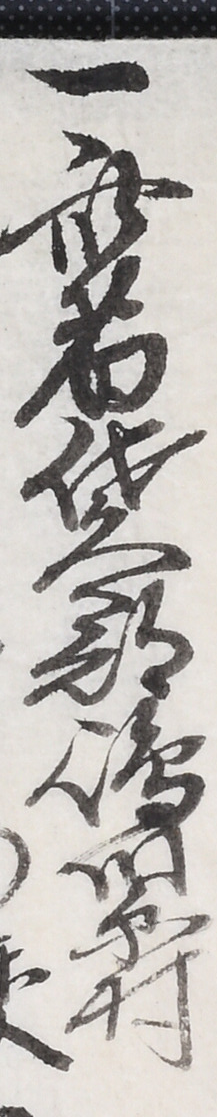一此者佐久郡島川原村
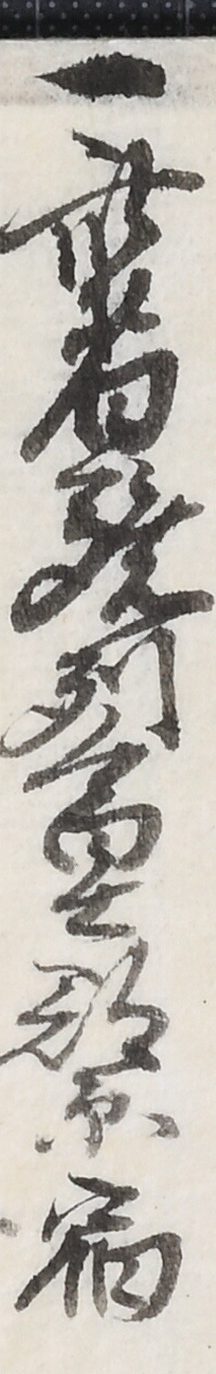一此者駿州富士郡原宿
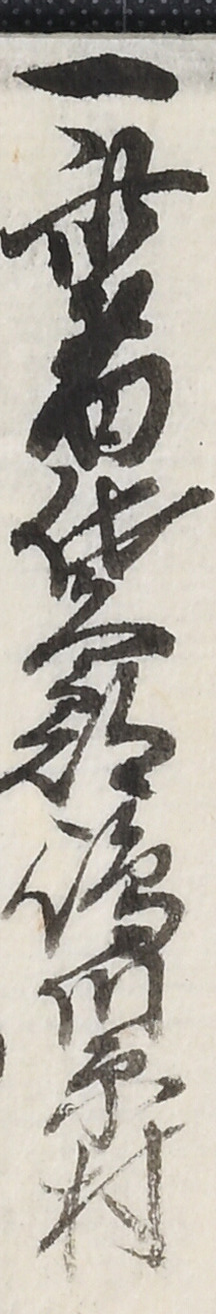一此者佐久郡島川原村
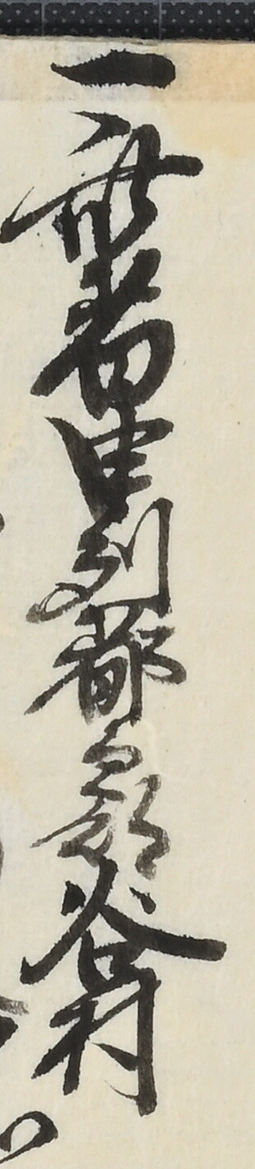一此者甲州都留郡谷村

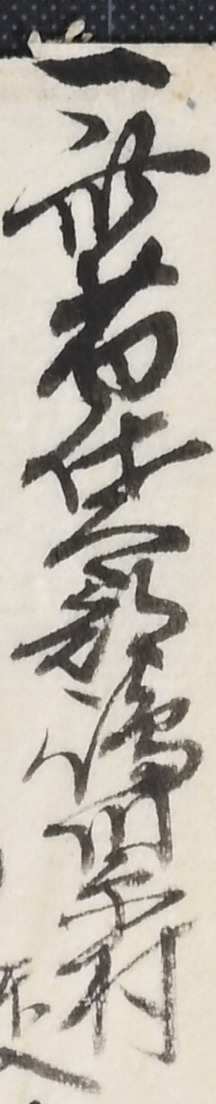一此者佐久郡島川原村
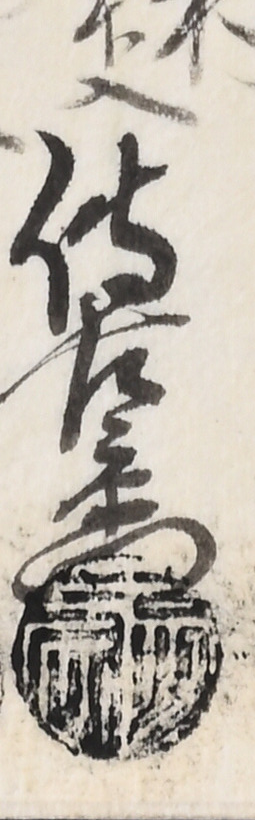久右衛門
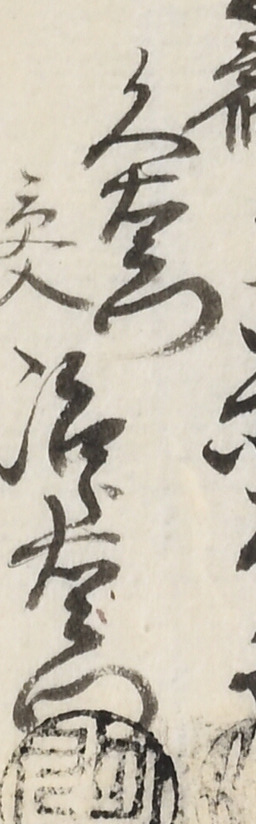久右衛門
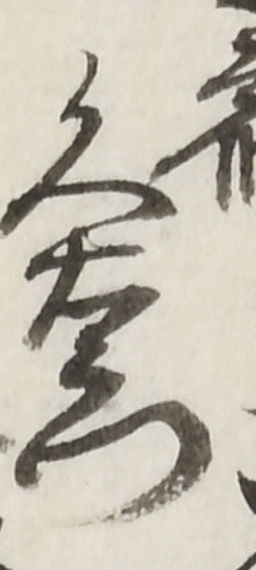久右衛門
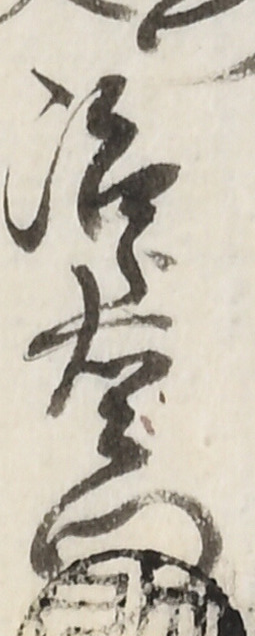久右衛門
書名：文久二壬戌年正月他国石切名前書上帳
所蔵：伊那市立高遠町図書館・合同会社AMANE
